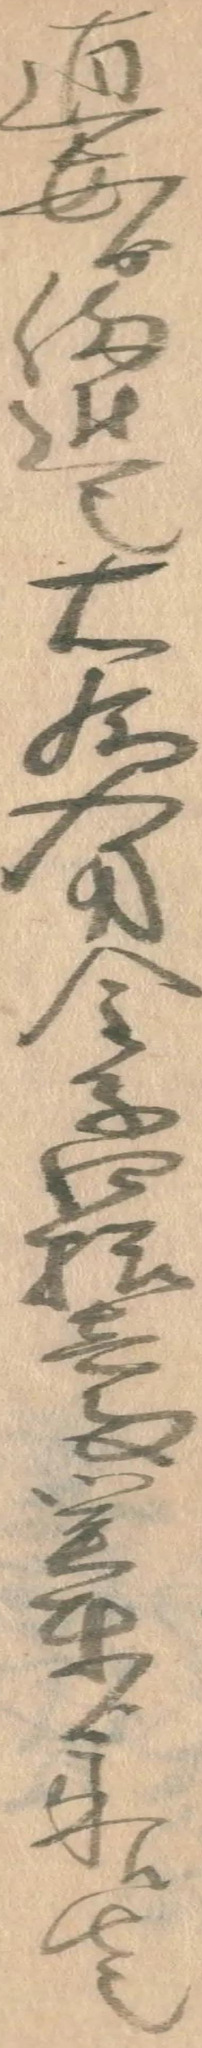直安ゟ備進也右為入用金子四拾壱匁関東ゟ来ル由也
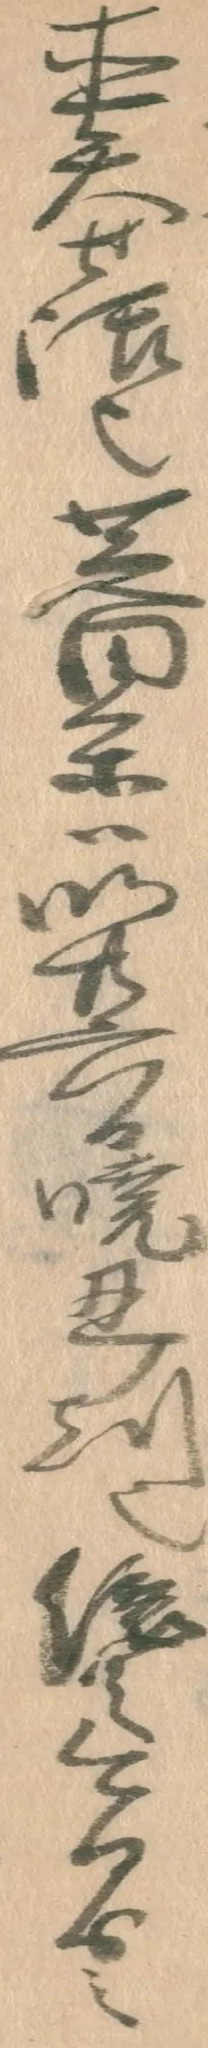直矢世話也芝田楽ハ明廿六日暁丑ノ刻也依之今日ゟ之
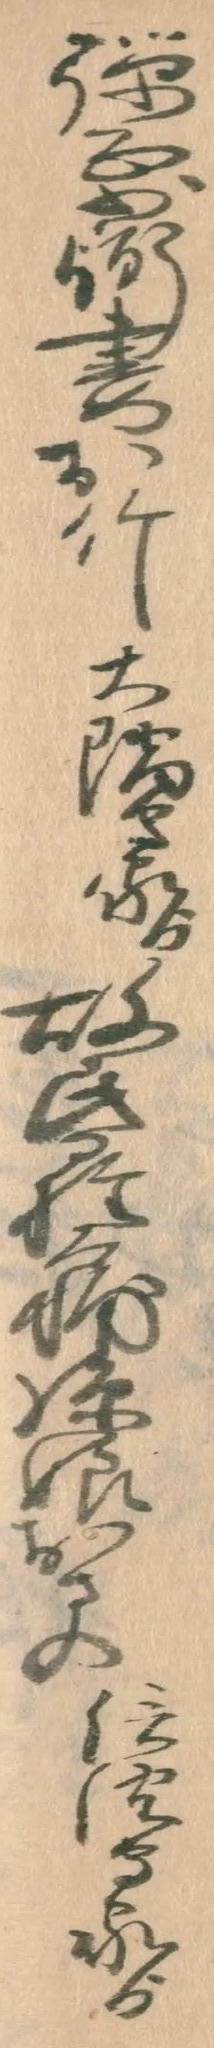弾正少弼妻お竹大隅守家ゟ故民部権大輔孫娘おさの信濃守家ゟ
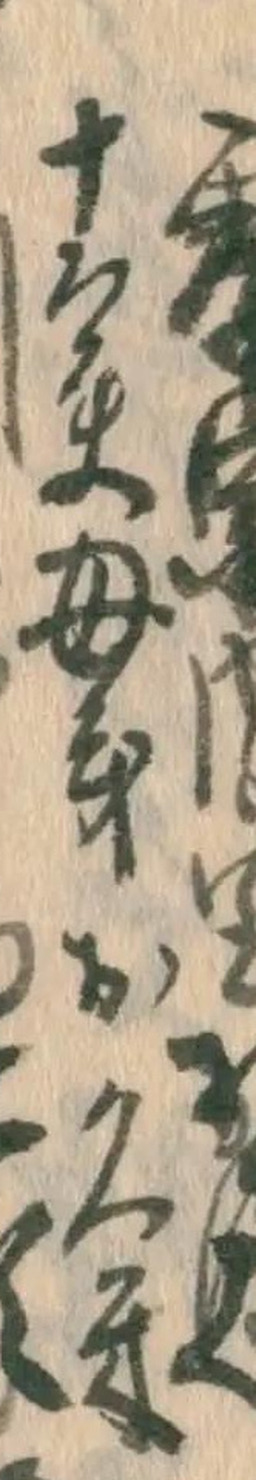十太夫母義お久米
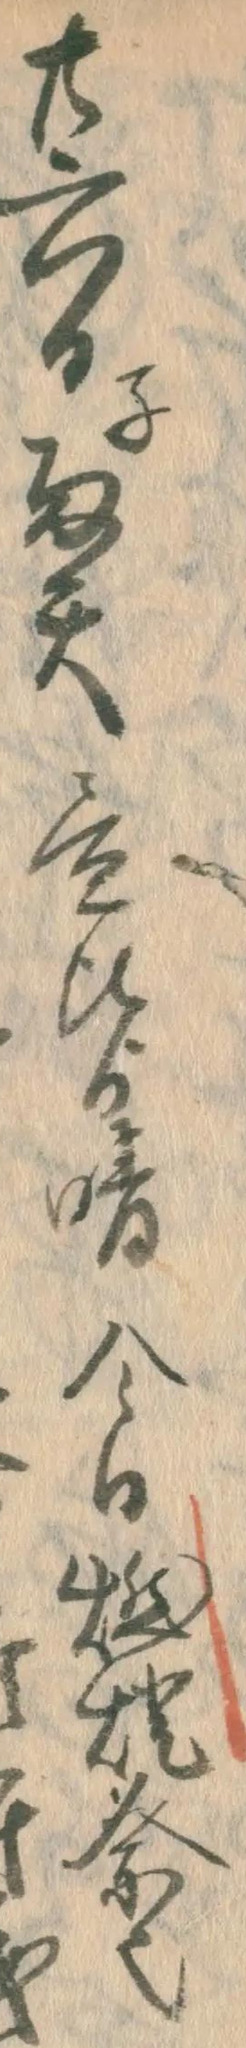廿六日子雨天昼比ゟ晴今日燃燈祭之
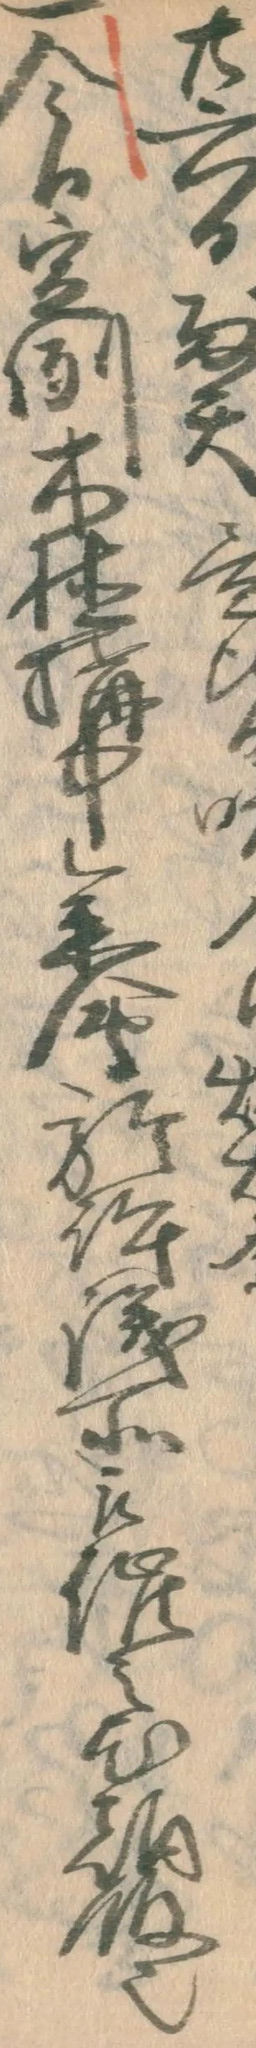一今日定例木植構中参会於評議所被催之尤朝飯也
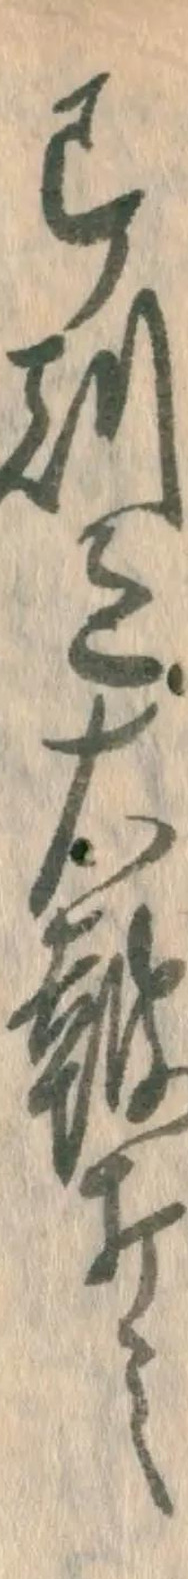巳ノ刻過大鼓打之
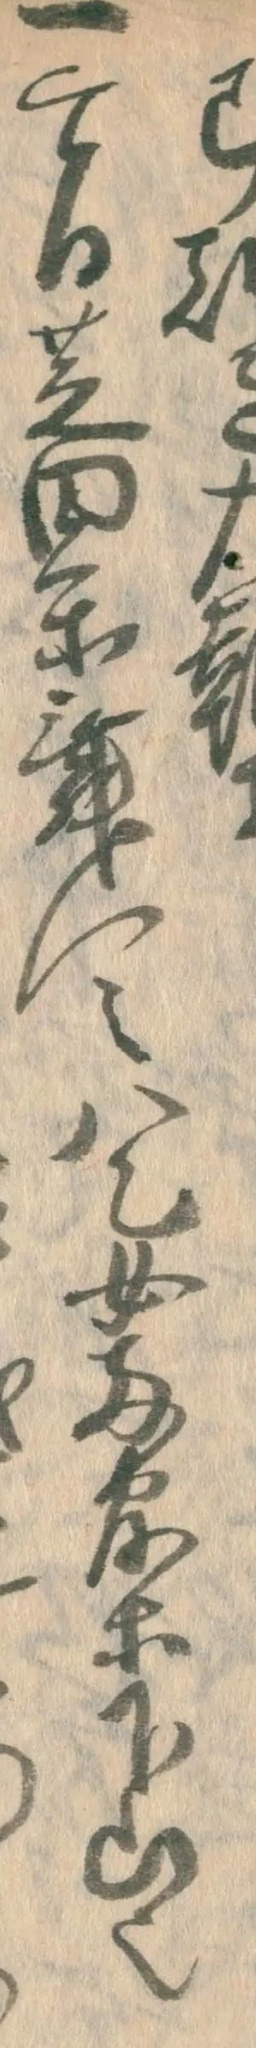一今日芝田楽舞人之八乙女両官等下山也
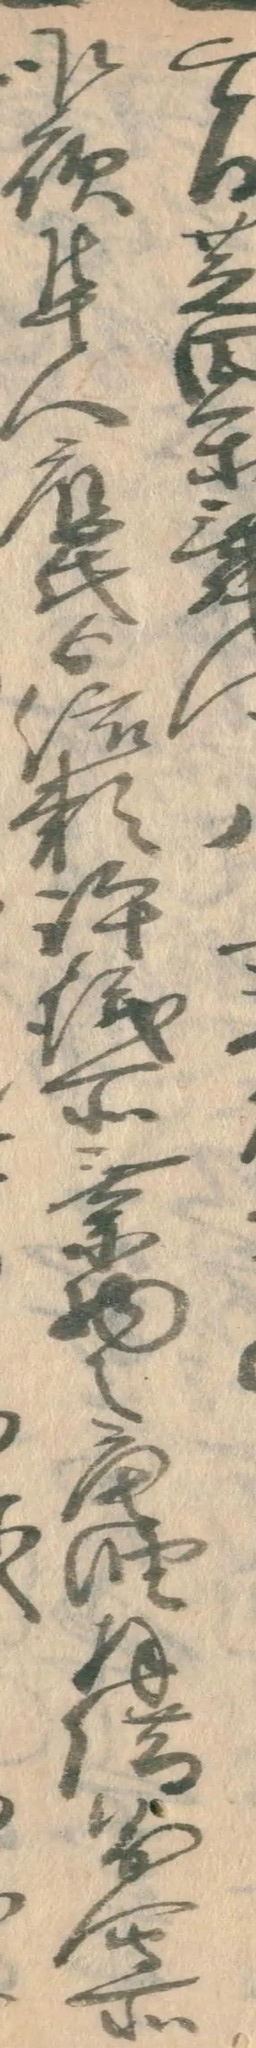一昨夜隼人応氏ゟ依頼評議所乗物之唐拝借則会所
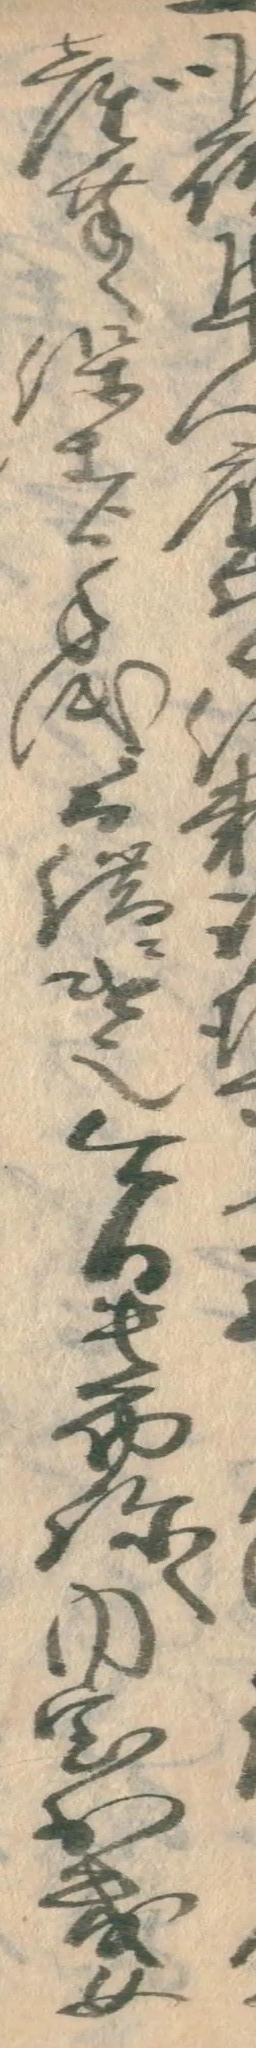産幸へ保土ゟ手紙ニ而借ニ遣也今日貴布祢へ内室お幾女
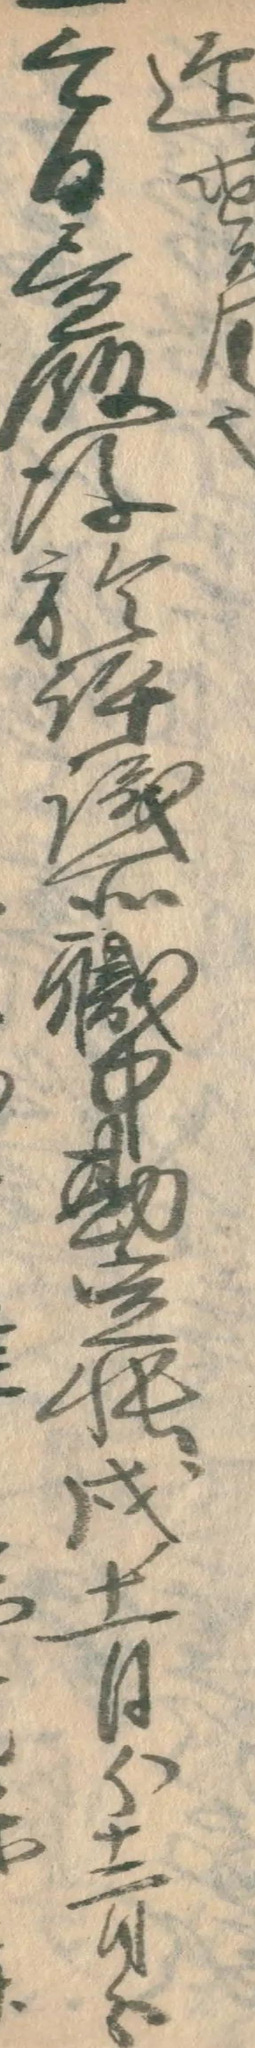一今日昼飯後於評議所職中勘定帳戌ノ十一月分十二月分
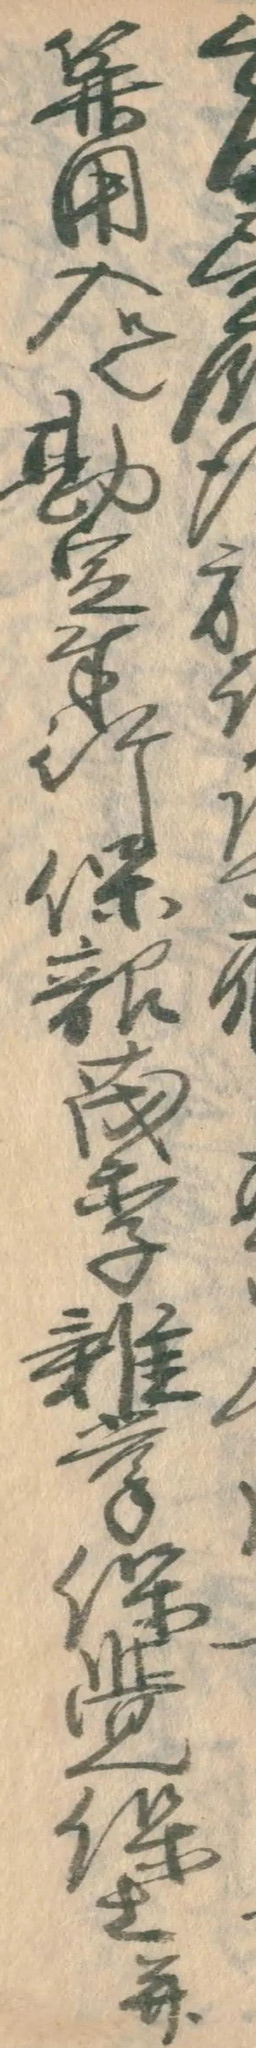算用入ル也勘定奉行保韶茂季雑掌保覚保士并

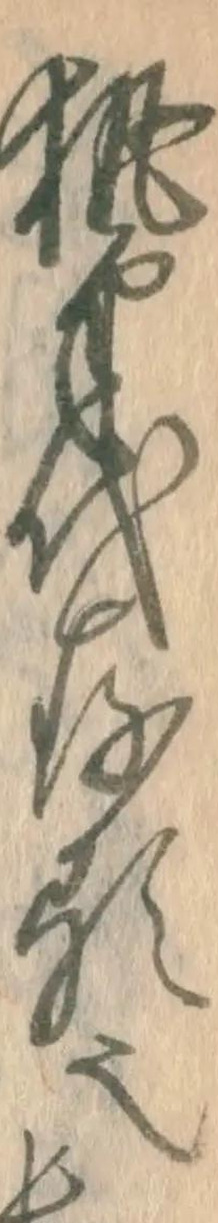執筆代存顕也
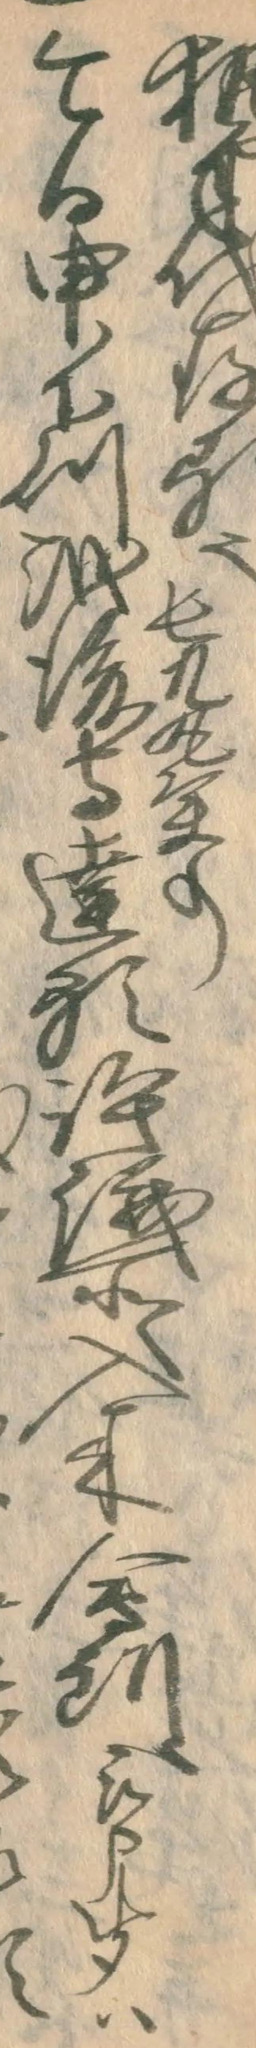一今日申ノ下刻越後守達顕評議所へ入来会所へ被申聞ハ
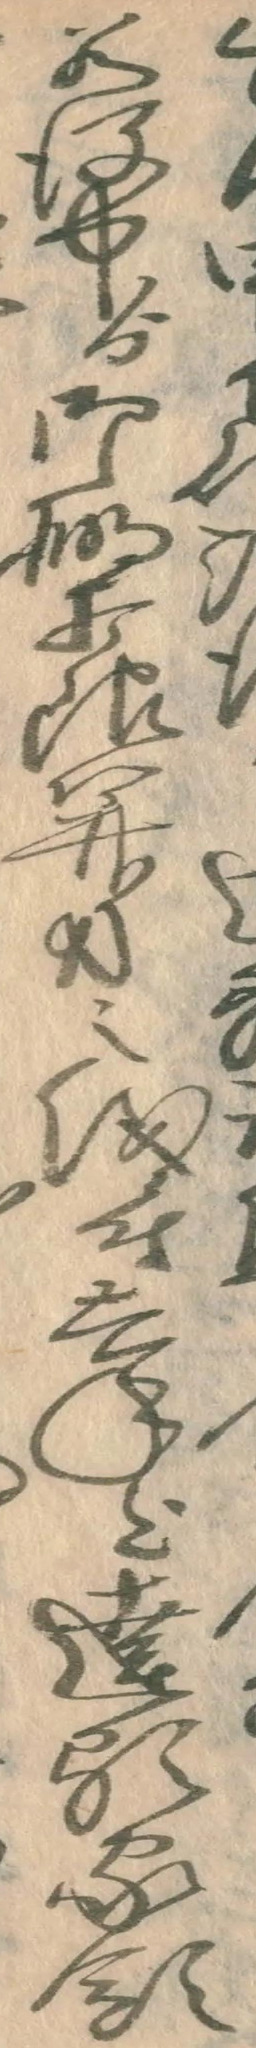若役中ゟ御棚打銀算用之儀ニ付去年迄達顕家領
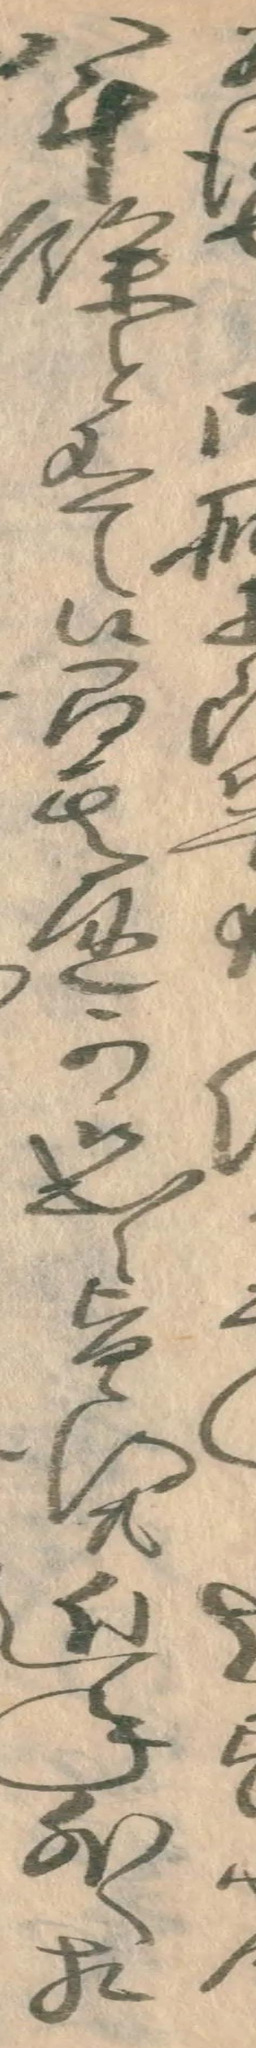八斗余と有之候間其通可被出候旨候得共近年外へ相
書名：賀茂社記録. 第60冊
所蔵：国立国会図書館 National Diet Library, JAPAN
